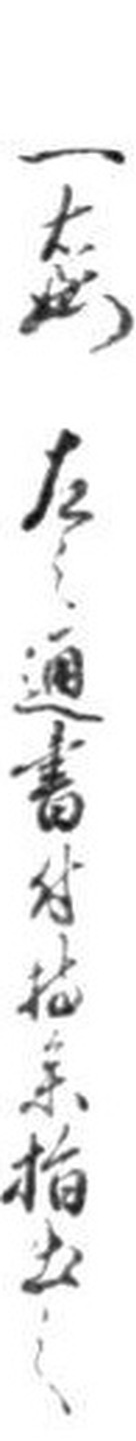一右衛門左之通書付持参指出之
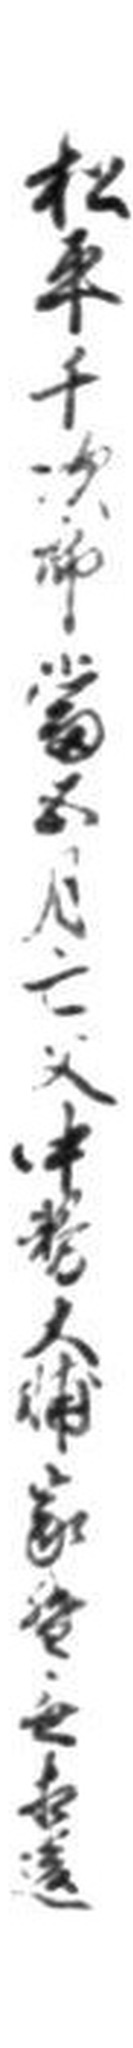松平千次郎当五月亡父中務大輔家督無相違
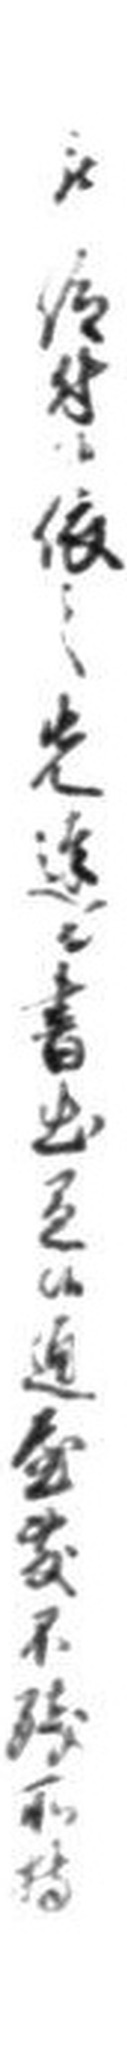被仰付候依之先達而書出置候通屋敷不残所持
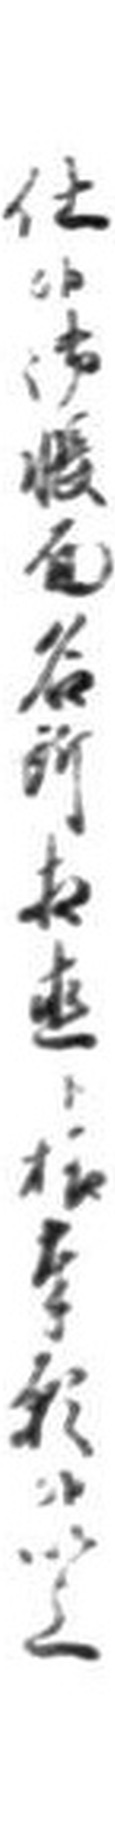仕候御帳面名所相直候様奉願候以上
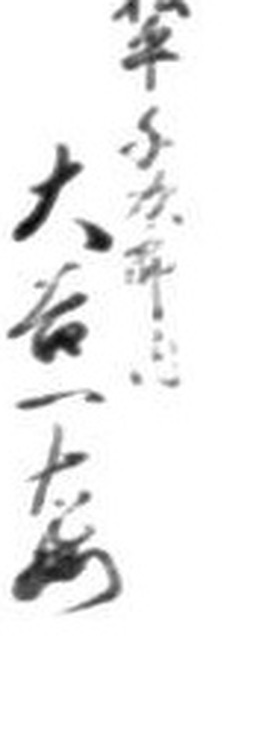大谷一右衛門
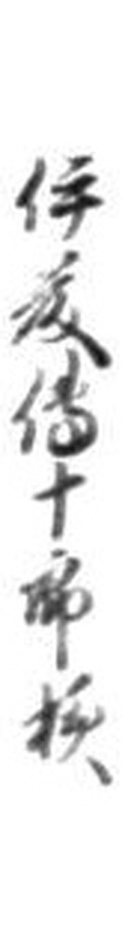伊藤伝十郎様
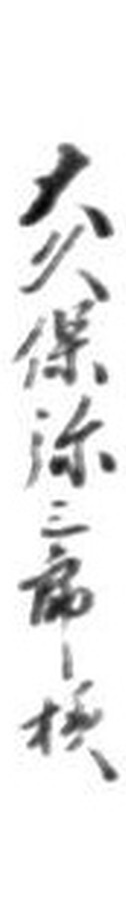大久保弥三郎様
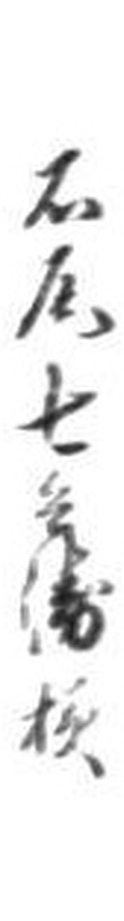石七兵衛様
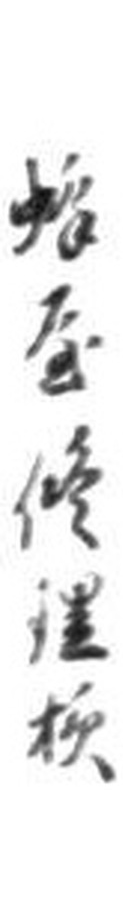蜂屋修理様

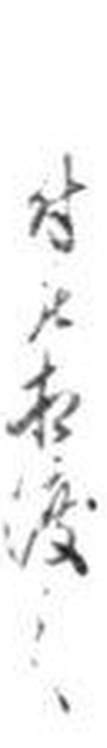付被相渡之
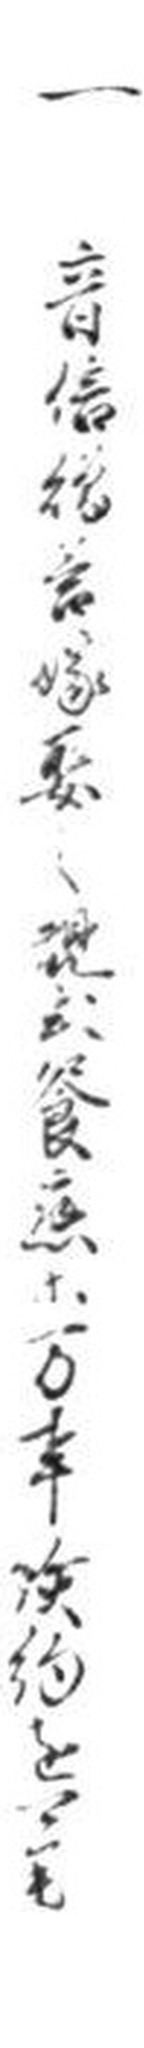一音信贈答嫁娶之規式饗応等万事倹約を可用
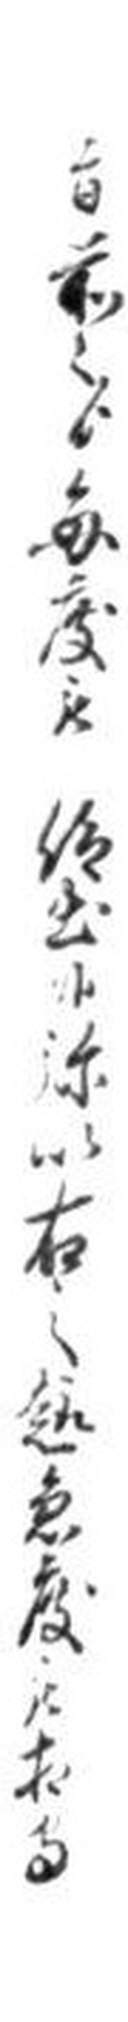旨前々ゟ毎度被仰出候弥以右之趣急度被相守
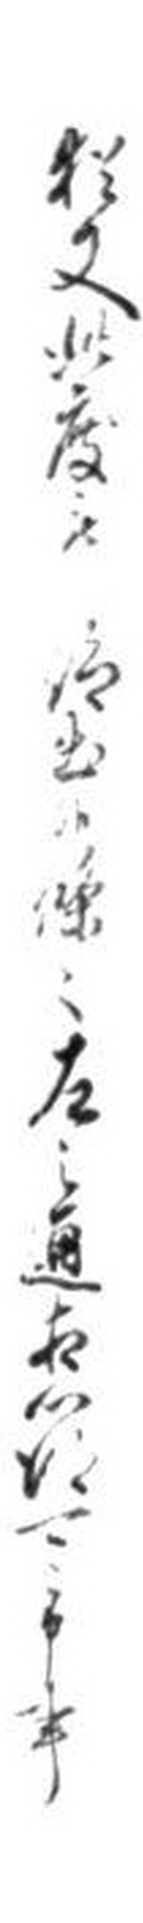猶又此度被仰出候条々左之通相心得可被申事
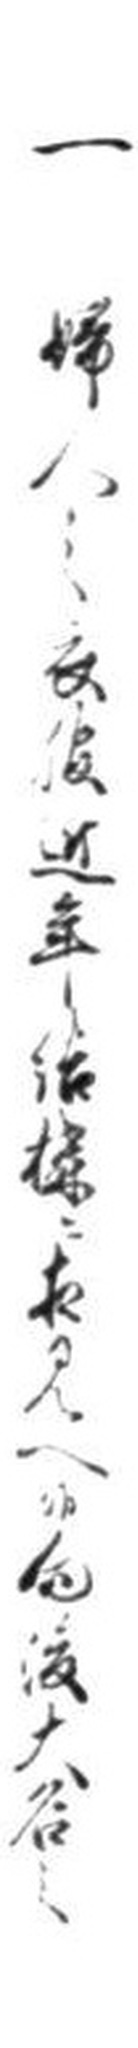一婦人之衣服近年結構ニ相見へ候向後大名之
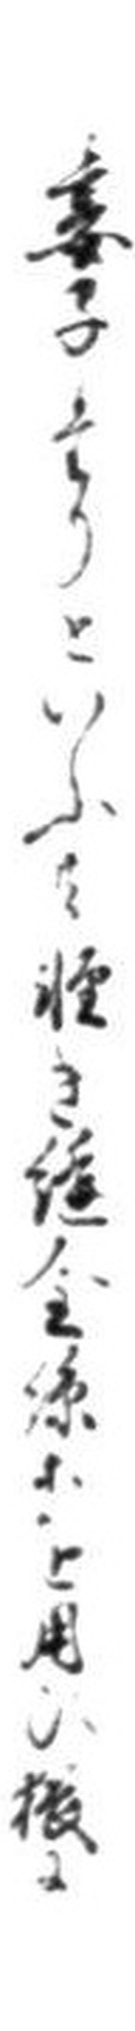妻子たりといふ共軽き縫金絲等を用ひ猥に
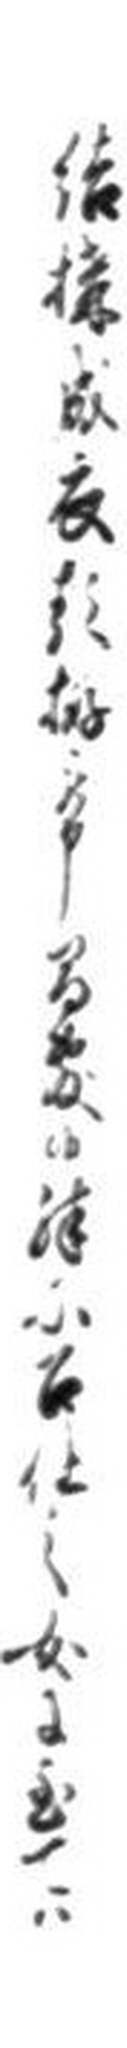結構成衣類拵被申間敷候殊に召仕之女に至てハ
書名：家譜 三十八 宗矩公 従享保九年五月到享保九年十二月
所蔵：福井県文書館 Fukui Prefectural Archives
